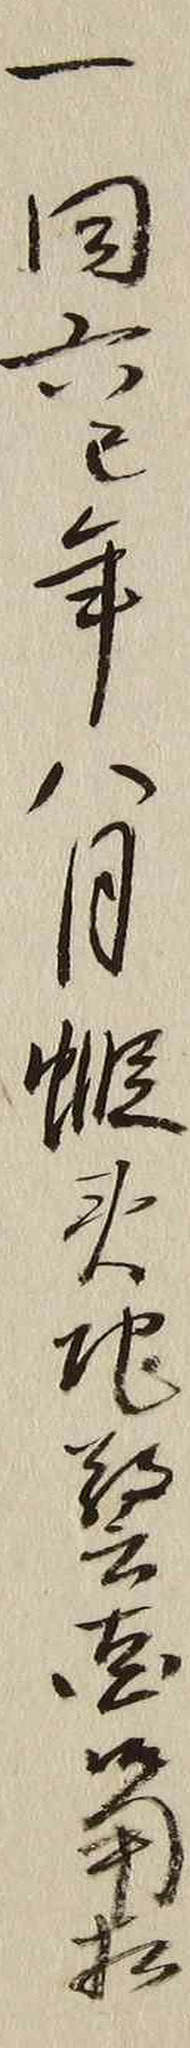一同六巳年八月蝦夷地警固御用相
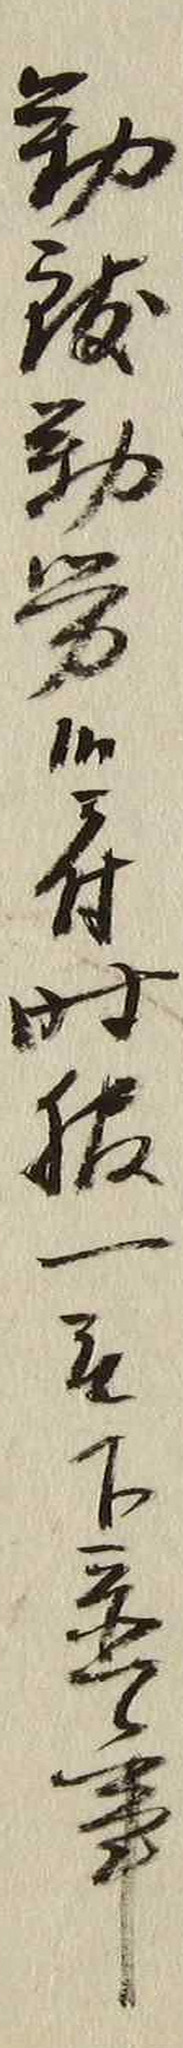勤致勤労候ニ付時服一被下置候事
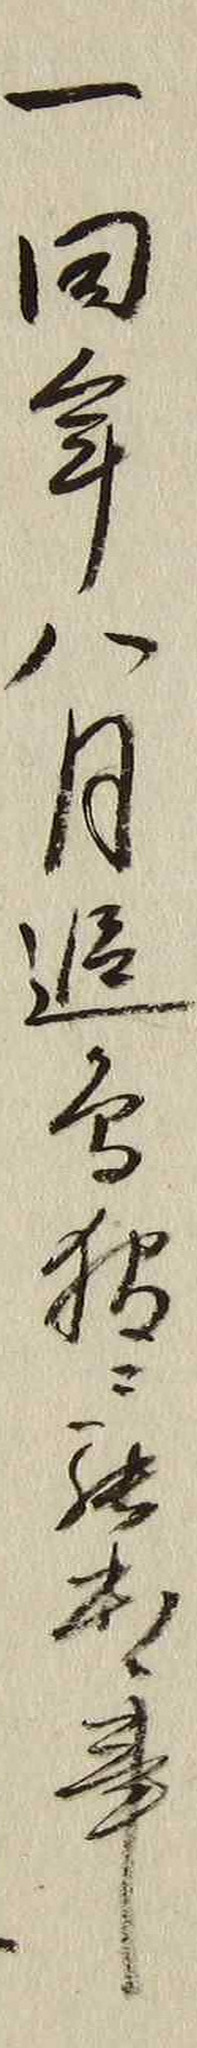一同年八月追鳥狩ニ罷出候事
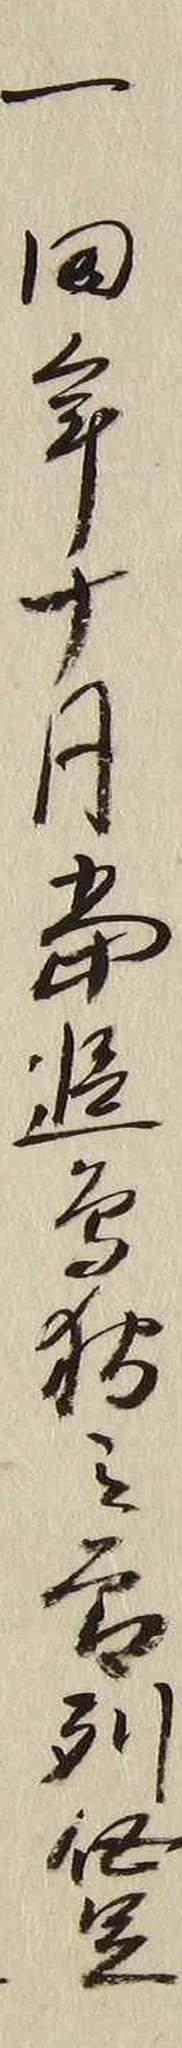一同年十月当追鳥狩之節列伍足
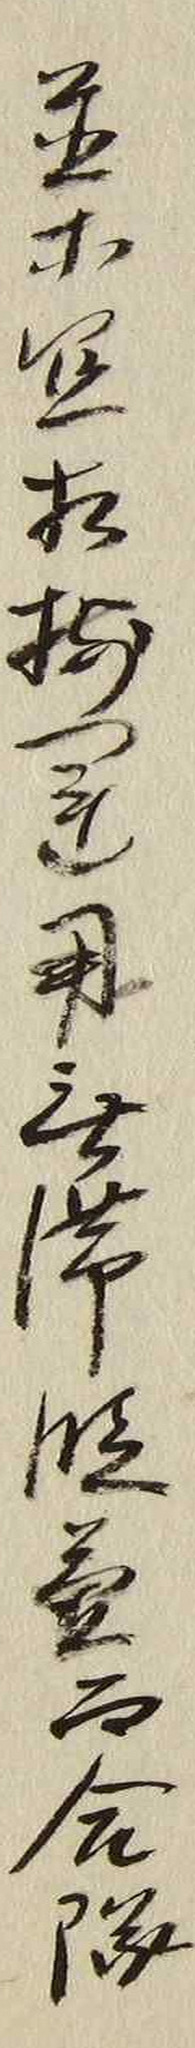並等宜相揃運用無滞段兼而合隊
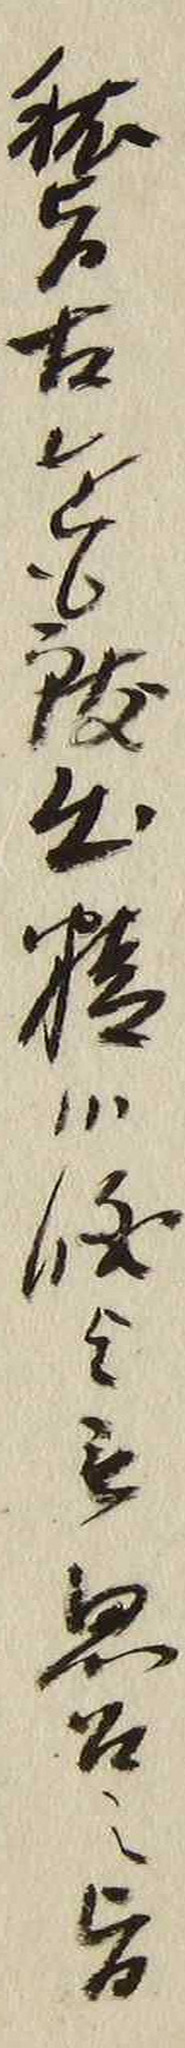稽古をも致出精候儀与被思召之旨
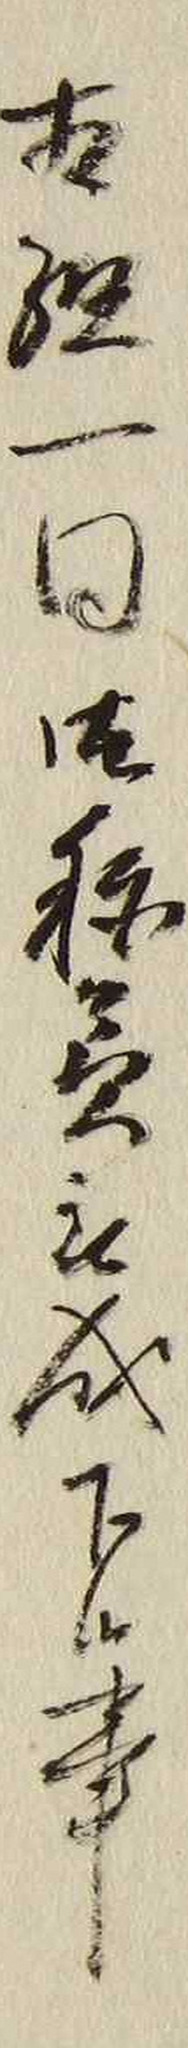相組一同御称美被成下候事
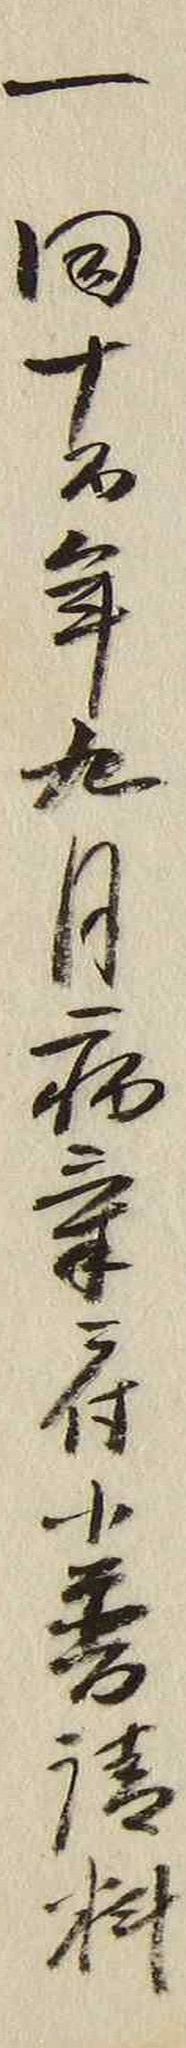一同十酉年九月病気ニ付小普請料

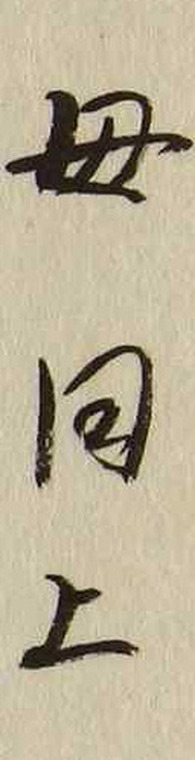母同上
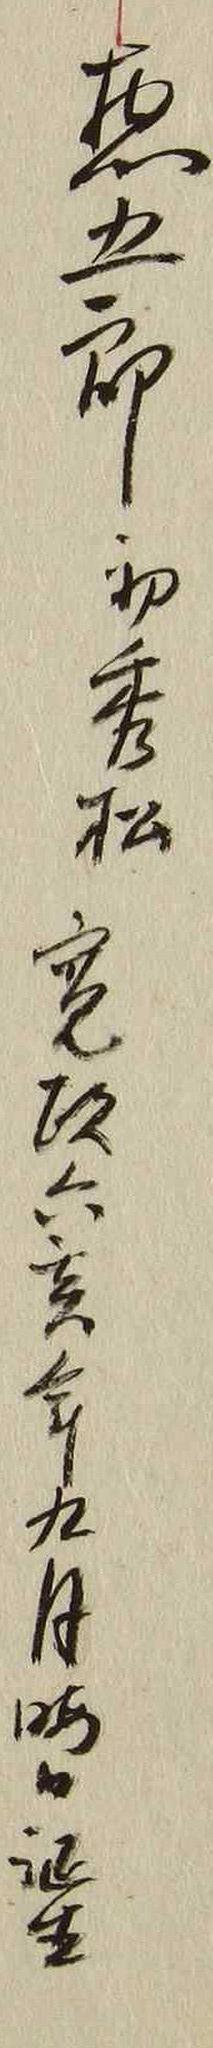惣五郎初秀松寛政六亥年九月晦日誕生
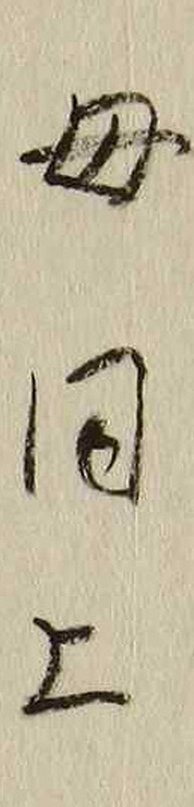母同上
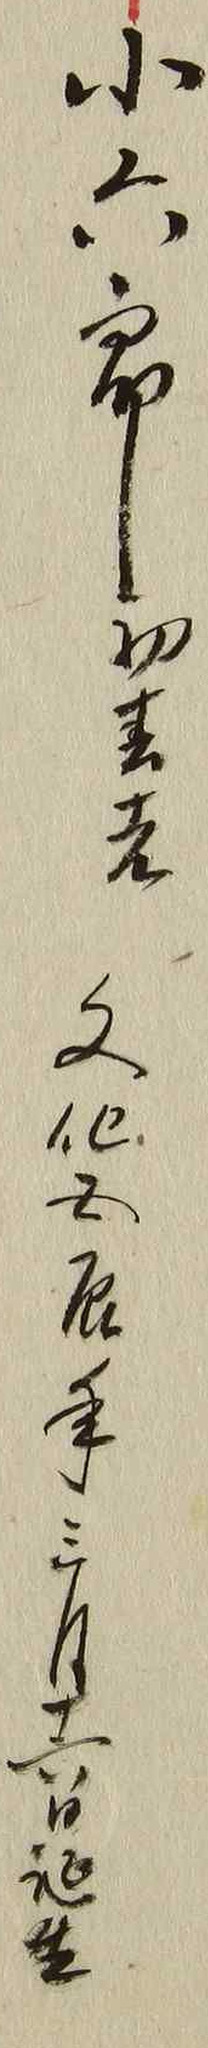小六郎初春光文化五辰年三月十六日誕生
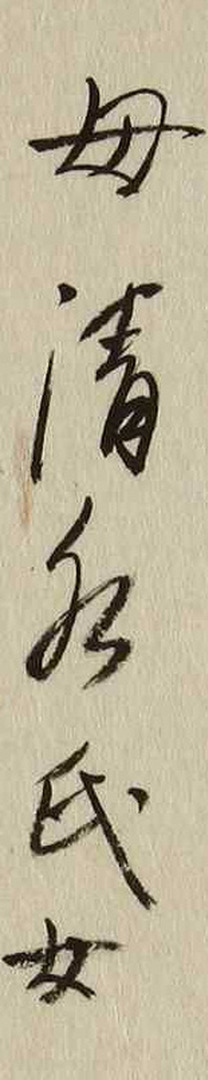母清水氏女

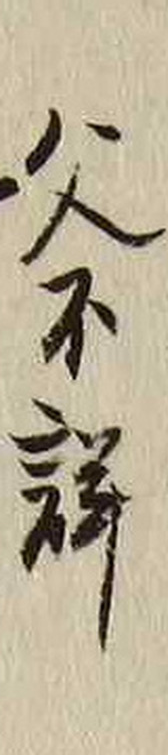父不詳
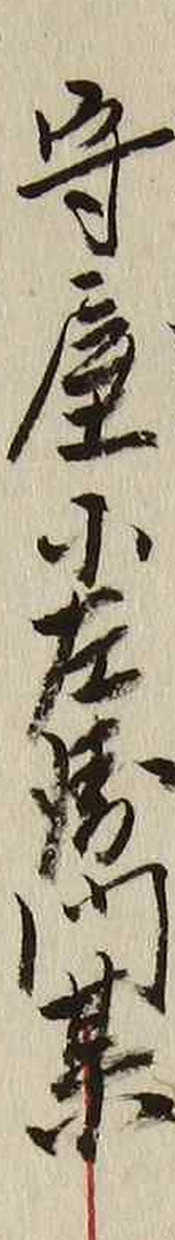守屋小左衛門某
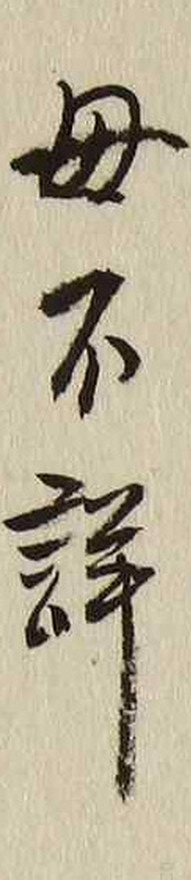母不詳
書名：諸士系譜　巻之349　も之部5
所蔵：会津若松市立会津図書館
